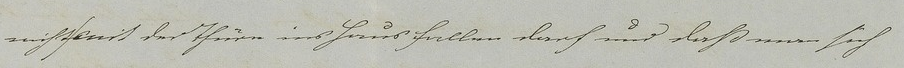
nicht mit der Thüre ins Haus fallen darf und daß man sich
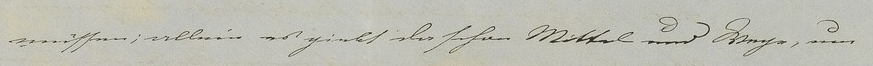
müssen; allein es giebt da schon Mittel und Wege, um
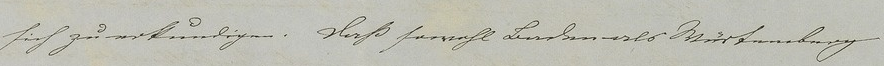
sich zu erkundigen. Daß sowohl Baden als Würtemberg
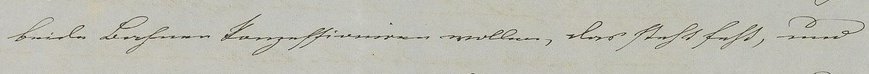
beide Bahnen konzessioniren wollen, das steht fest, und
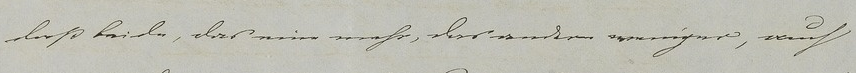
daß beide, das eine mehr, das andere weniger, auch
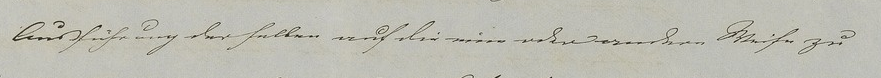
Ausführung derselben auf die eine oder andere Weise zu
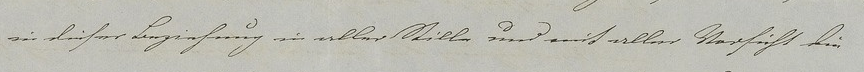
in dieser Beziehung in aller Stille und mit aller Vorsicht die
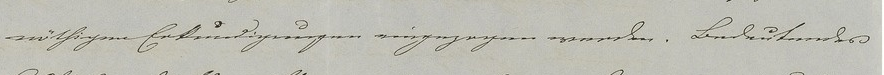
nöthigen Erkundigungen eingezogen werden. Bedeutendes
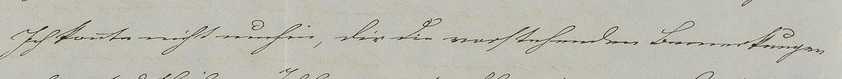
Ich konnte nicht umhin, dir die vorstehenden Bemerkungen
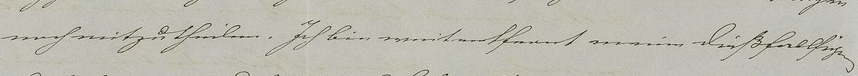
noch mitzutheilen. Ich bin weit entfernt meine dießfallsigen
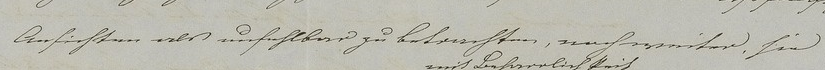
Ansichten als unfehlbar zu betrachten, noch weiter, sie
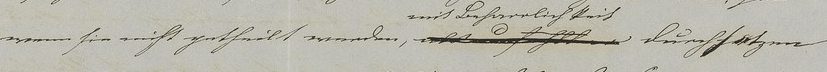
wenn sie nicht getheilt werden, als unfehlbarmit Beharrlichkeit durchsetzen
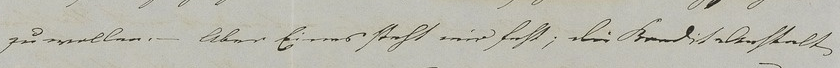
zu wollen. – Aber Eines steht mir fest; die Kredit-Anstalt
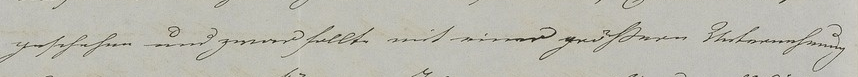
geschehen und zwar sollte mit einer größern Unternehmung
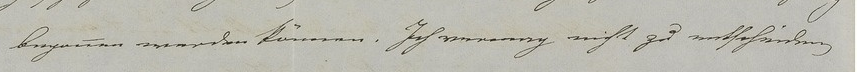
begonnen werden können. Ich vermag nicht zu entscheiden
